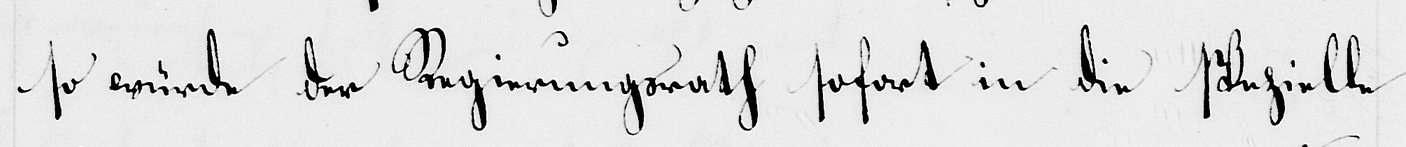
so würde der Regierungsrath sofort in die spezielle
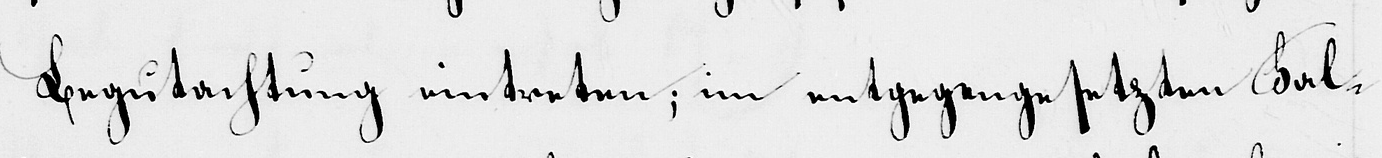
Begutachtung eintreten; im entgegengesetzten Fal¬
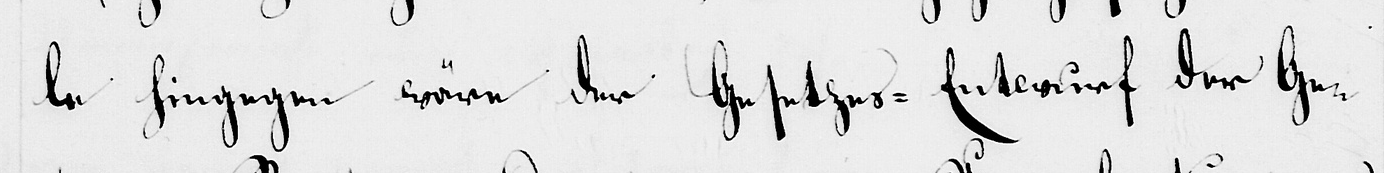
le hingegen wäre der Gesetzes-Entwurf der Ge¬
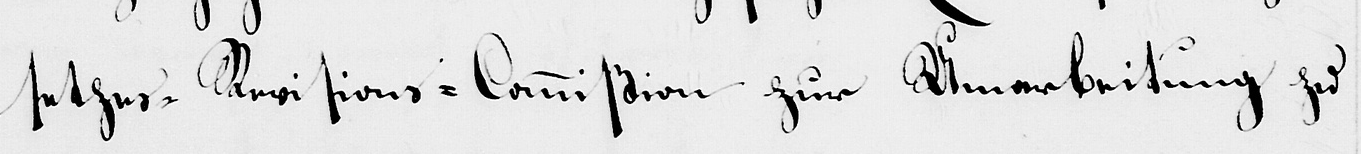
setzes-Revisions-Commißion zur Umarbeitung zu
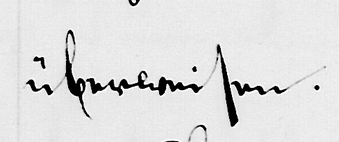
überweisen.
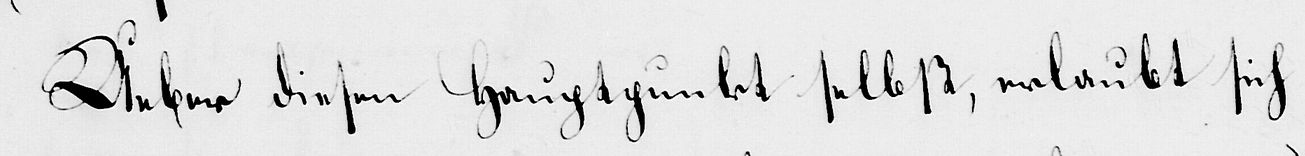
Ueber diesen Hauptpunkt selbst, erlaubt sich
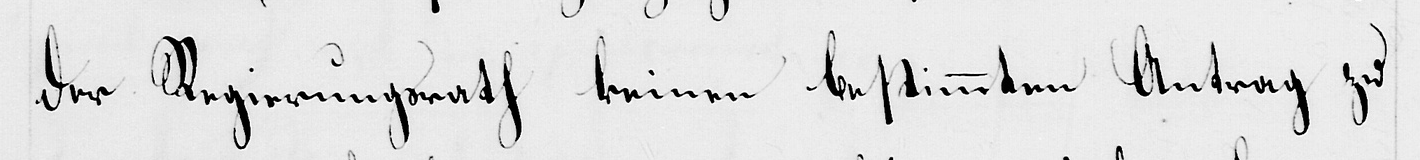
der Regierungsrath keinen bestimmten Antrag zu
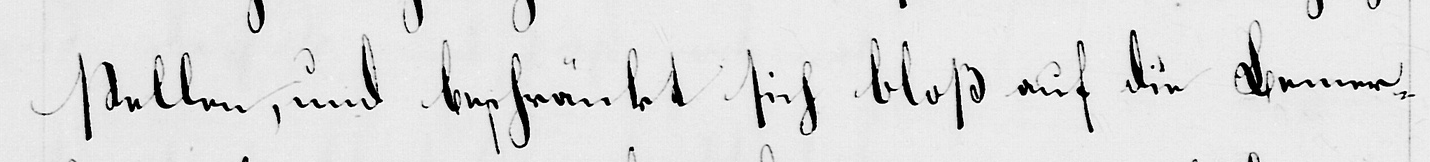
stellen, und beschränkt sich bloß auf die Bemer¬
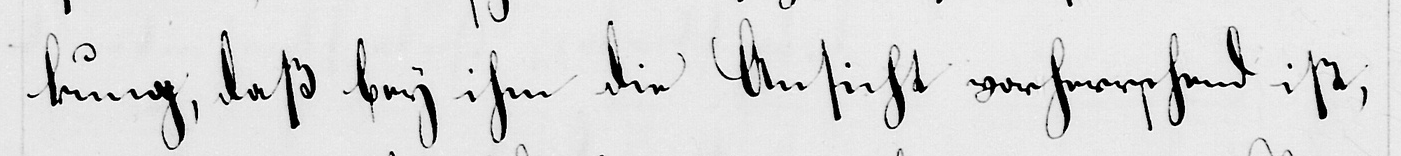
kung, daß bey ihm die Ansicht vorherrschend ist,
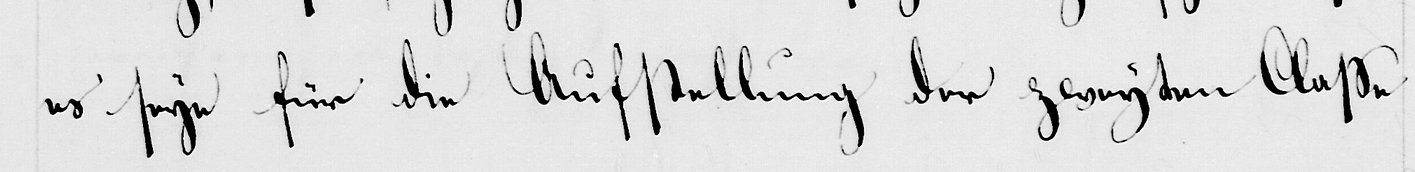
es seye für die Aufstellung der zweyten Claße
